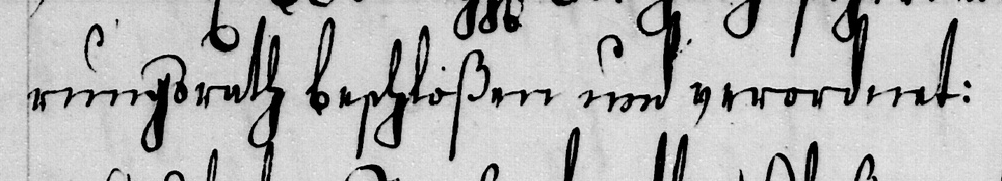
rungsrath beschloßen und verordnet:
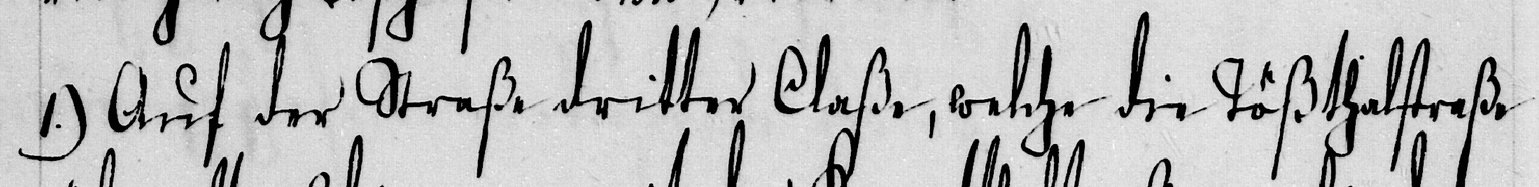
1.) Auf der Straße dritter Claße, welche die Tößthalstraße
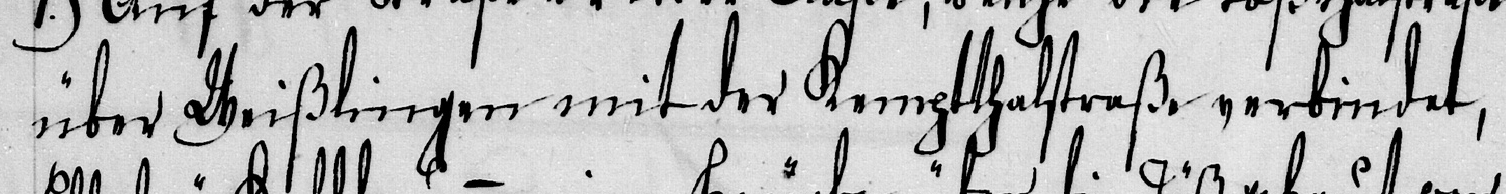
über Weißlingen mit der Kemptthalstraße verbindet,
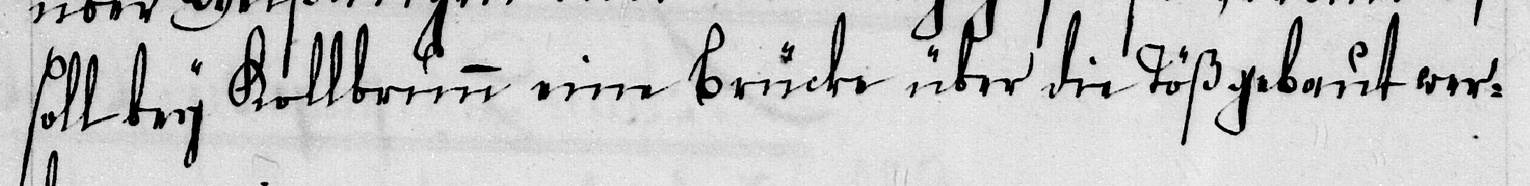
soll bey Kollbrunn eine Brücke über die Töß gebaut wer¬
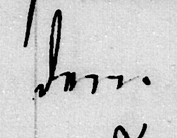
den.
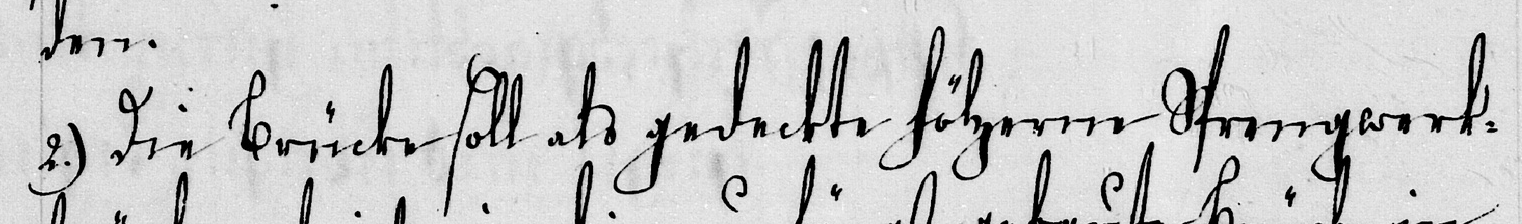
2.) Die Brücke soll als gedeckte hölzerne Sprengwerk¬
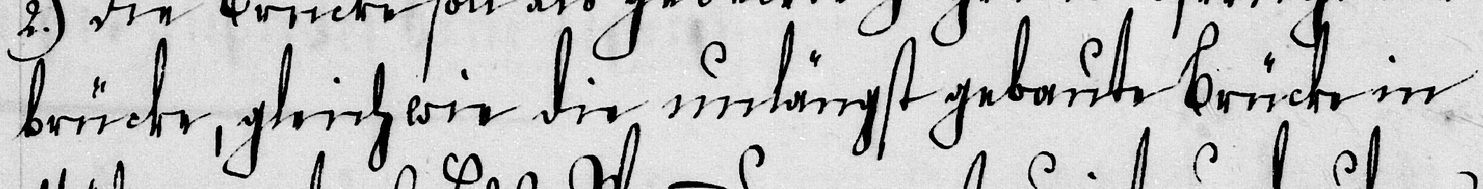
brücke, gleich wie die unlängst gebaute Brücke in
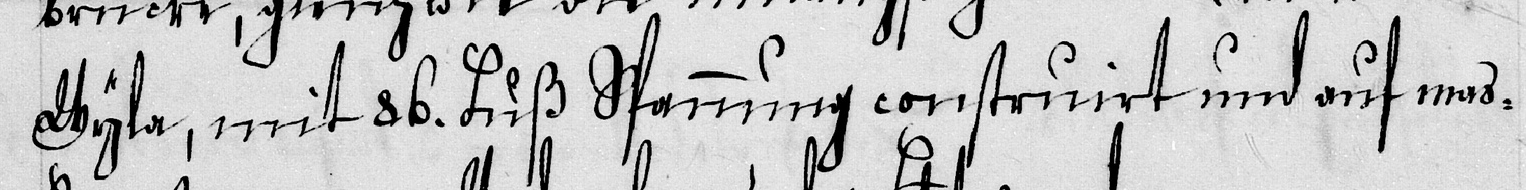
Wyla, mit 86. Fuß Spannung construirt und auf mas¬
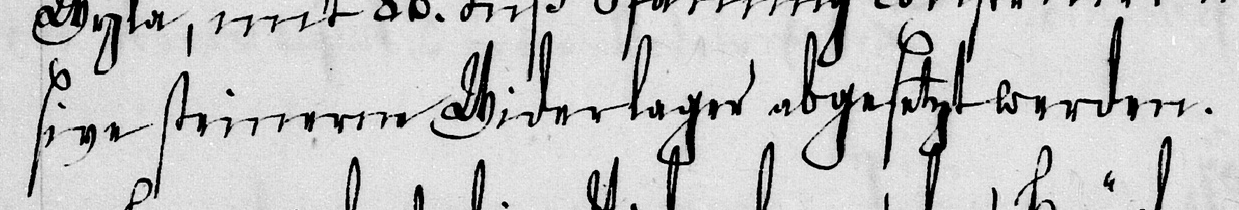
sive steinerne Widerlager abgesetzt werden.
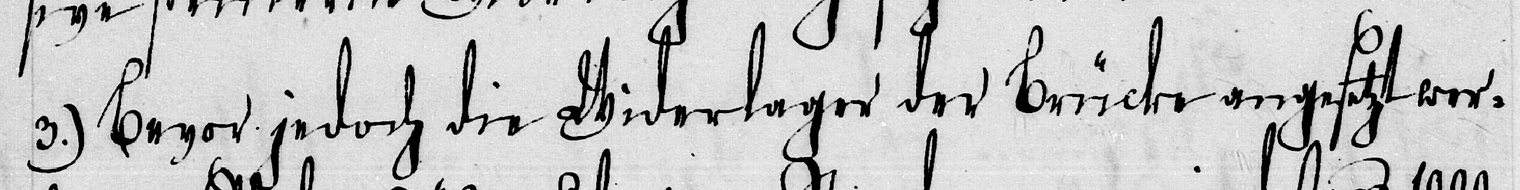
3.) Bevor jedoch die Widerlager der Brücke angesetzt wer¬
